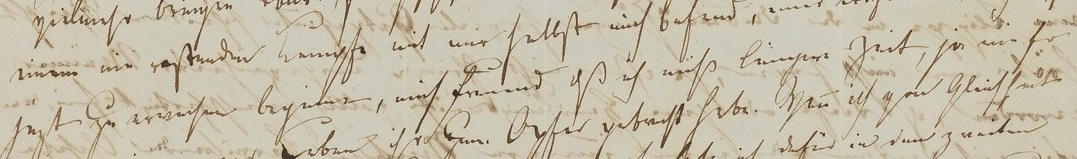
jezt zu erwachen beginne, mich freuend, dß ich nicht längere Zeit, ja wie so
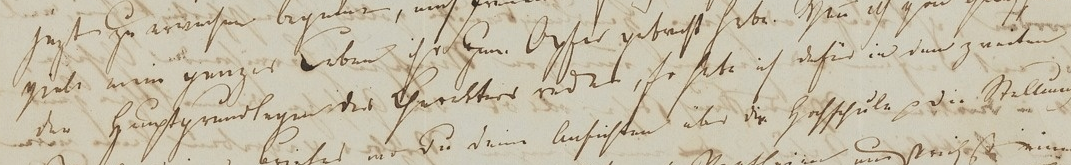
der Hauptgrundlagen des Charakters rede, so habe ich dafür in dem zweiten
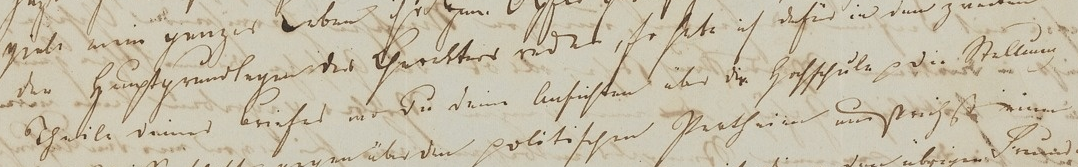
Theile deines Briefes wo du deine Ansichten über die Hochschule & die Stellung
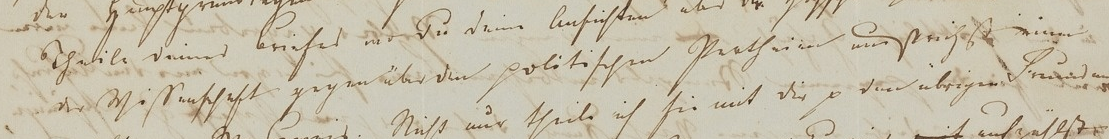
der Wißenschaft gegen über den politischen Partheien aussprichst einen
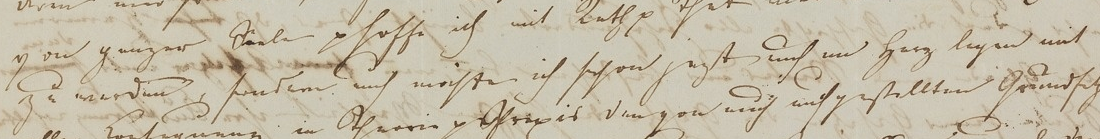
zu werden, sondern auch möchte ich schon jezt euch ans Herz legen mit
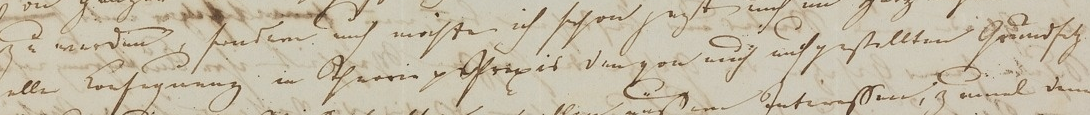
aller Consequenz in Theorie & Praxis den von euch aufgestellten Grundsatz
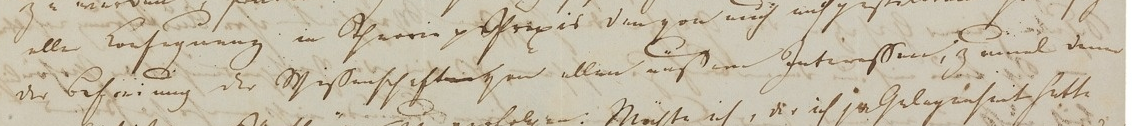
der Befreiung der Wißenschaften von allen äußern Intereßen, zumal denen
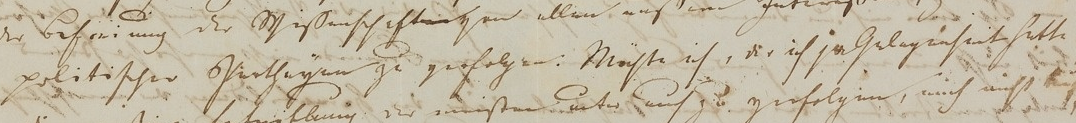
politischer Partheyen zu verfolgen. Möchte ich, der ich ja Gelegenheit hatte
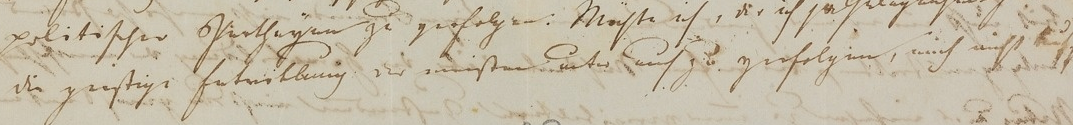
die geistige Entwicklung der meisten unter euch zu verfolgen, mich nicht
